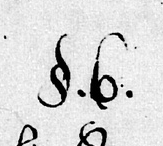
§. 6.
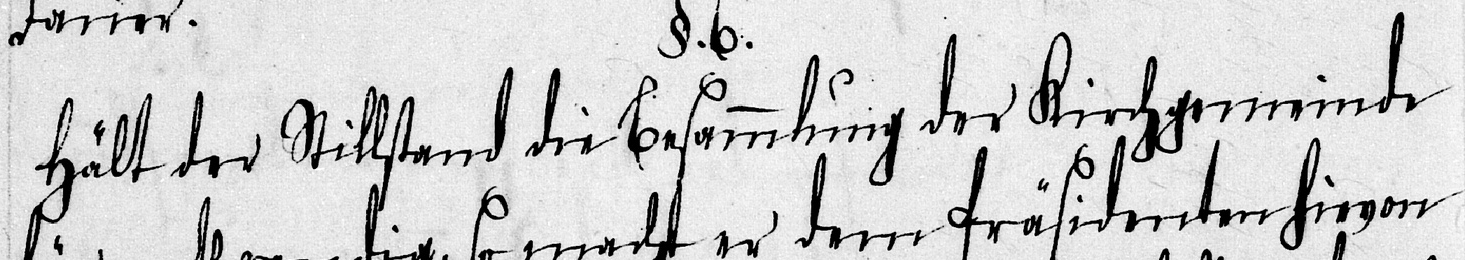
Hält der Stillstand die Besammlung der Kirchgemeinde
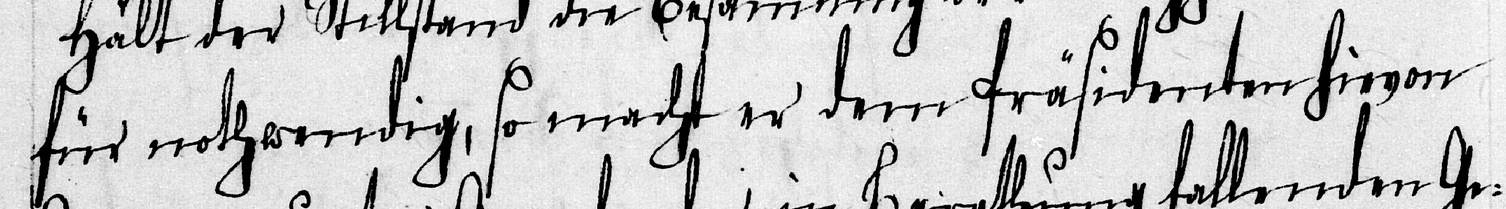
für nothwendig, so macht er dem Präsidenten hievon
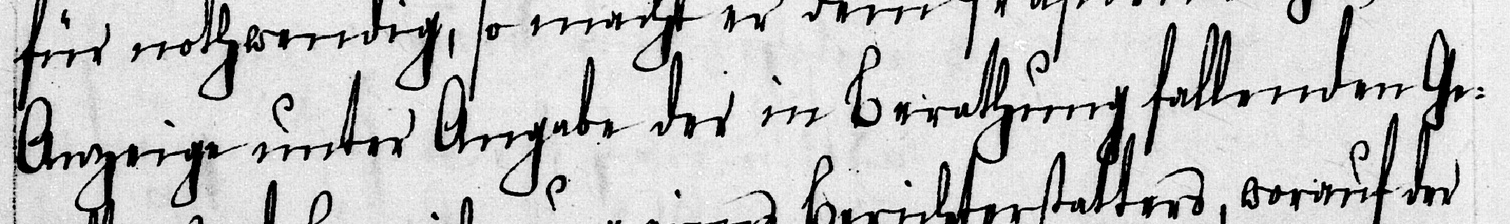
Anzeige unter Angabe der in Berathung fallenden Ge¬
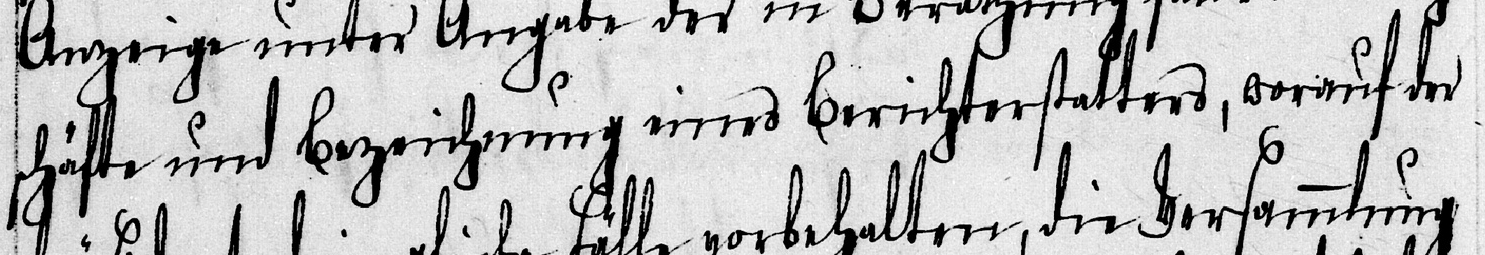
chäfte und Bezeichnung eines Berichterstatters, worauf der
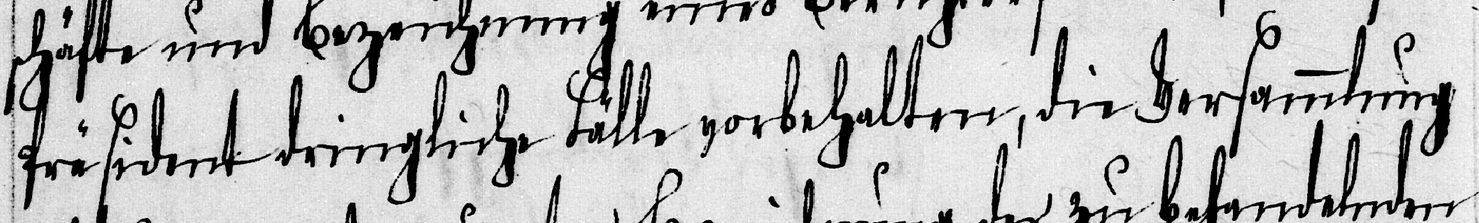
räsident dringliche Fälle vorbehalten, die Versammlung
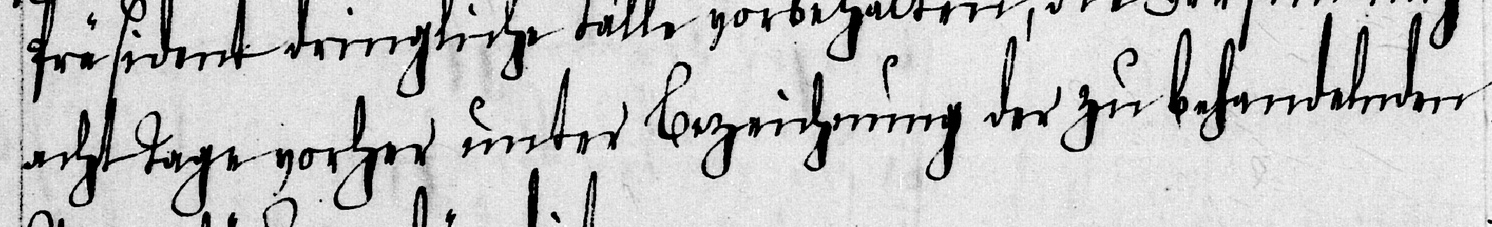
acht Tage vorher unter Bezeichnung der zu behandelnden
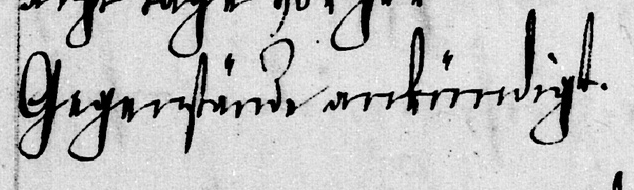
Gegenstände ankündigt.
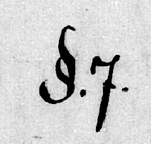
§. 7.
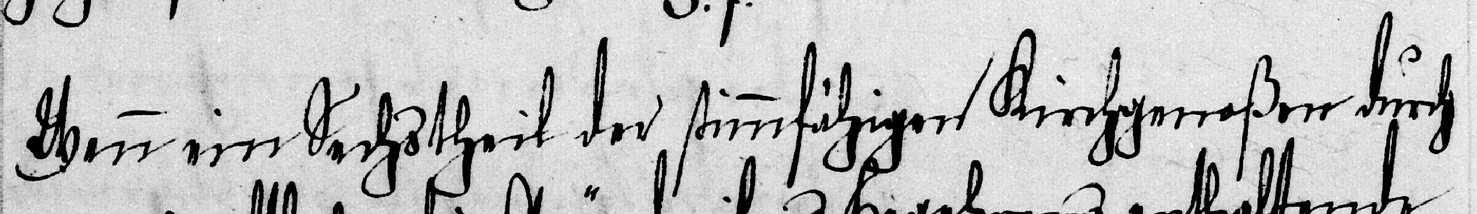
Wenn ein Sechstheil der stimmfähigen Kirchgenoßen durch
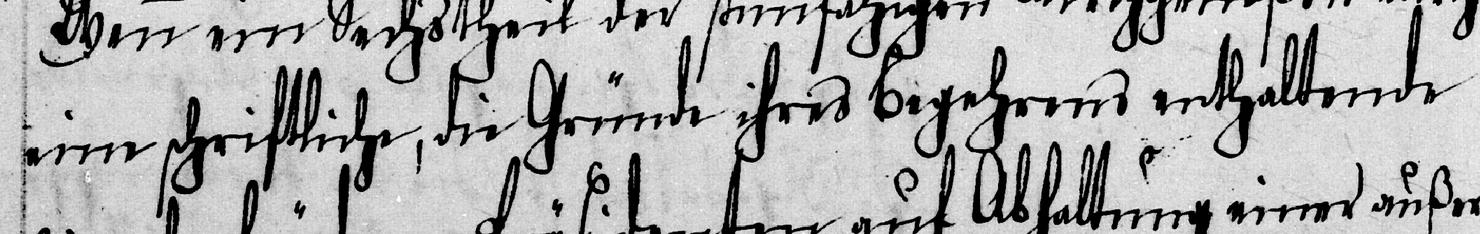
eine schriftliche, die Gründe ihres Begehrens enthaltende
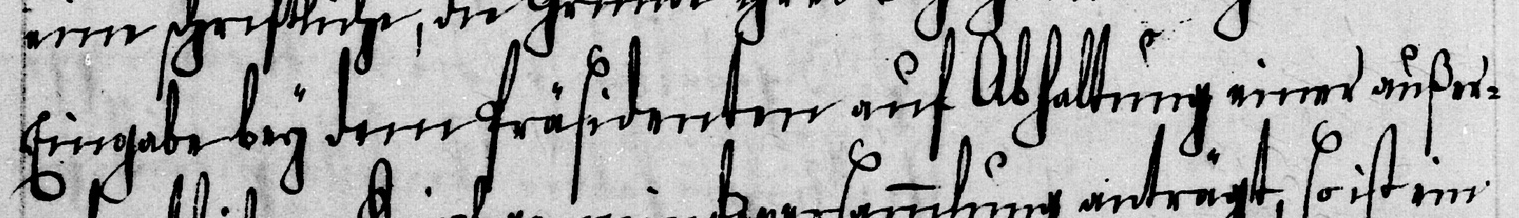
Eingabe bey dem Präsidenten auf Abhaltung einer außer¬
